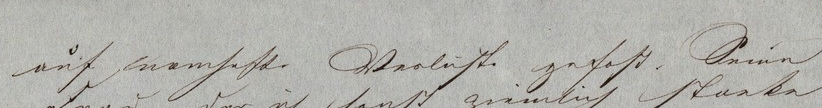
auf namhafte Verluste gefast. Seine
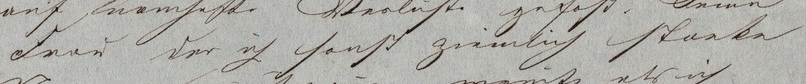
Frau der ich sonst ziemlich starke
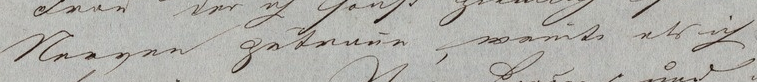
Nerven zutraue weinte als ich
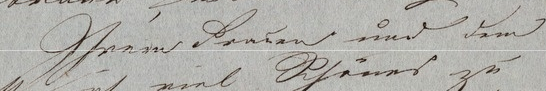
Ihren Frauen und dem
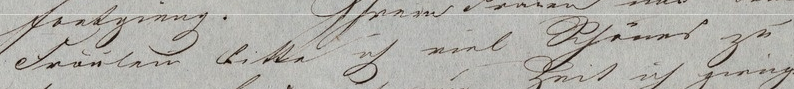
Fräulein bitte ich viel Schönes zu
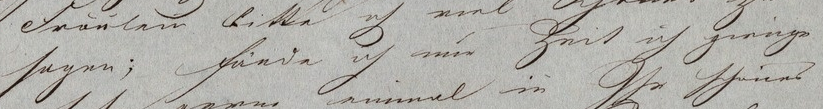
sagen; fände ich nur Zeit ich gienge
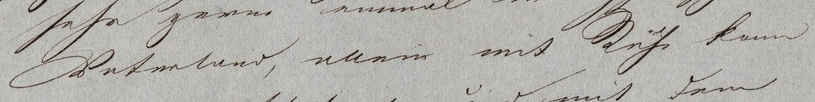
Vaterland, allein mit Ruhe kann
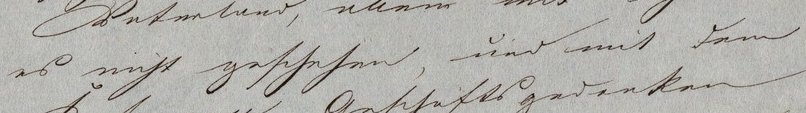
es nicht geschehen, und mit dem
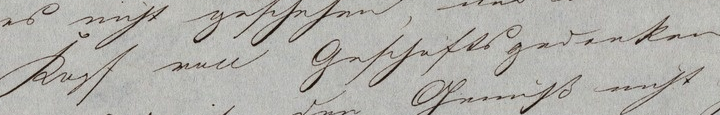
Kopf voll Geschäftsgedanken
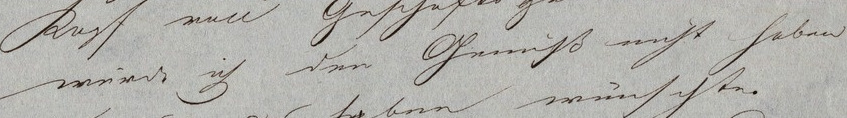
würde ich den Genuß nicht haben
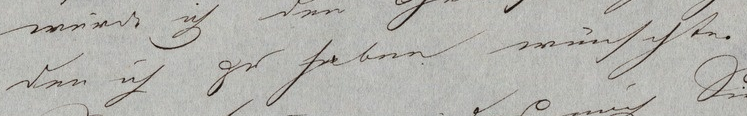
den ich zu haben wünschte.
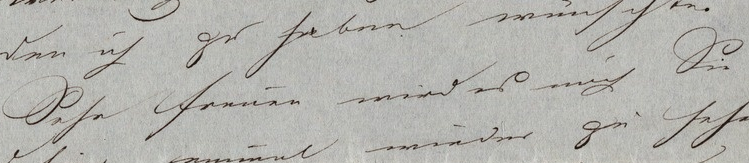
Sehr freuen wird es mich Sie
